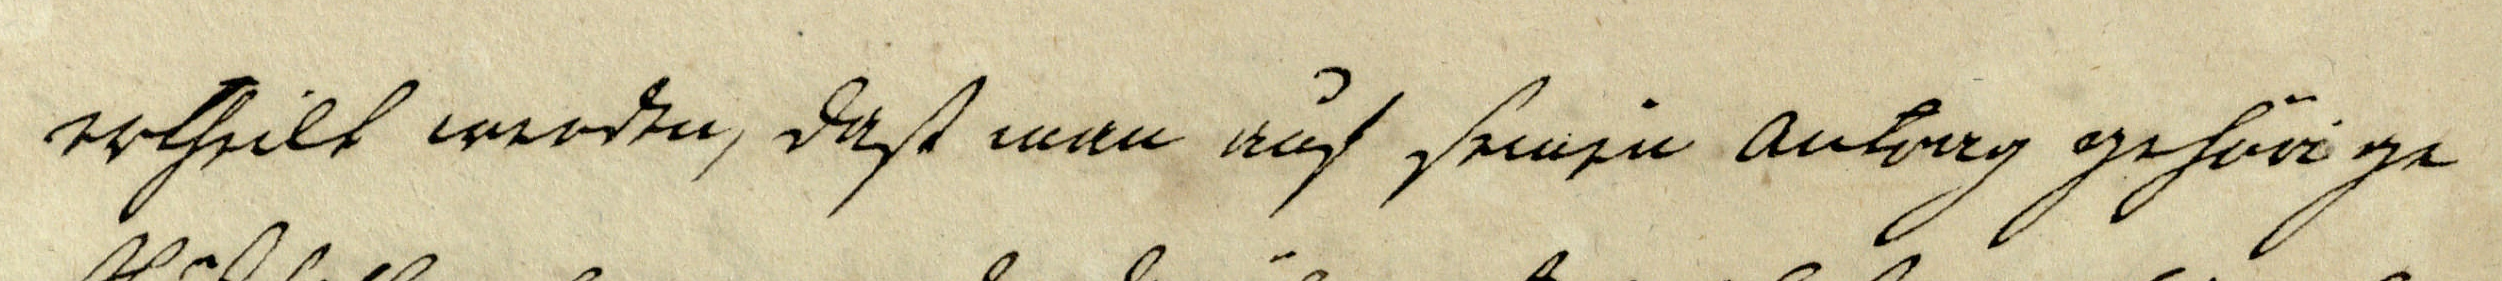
ertheilt werden, daß man auf seinen Antrag gehörige
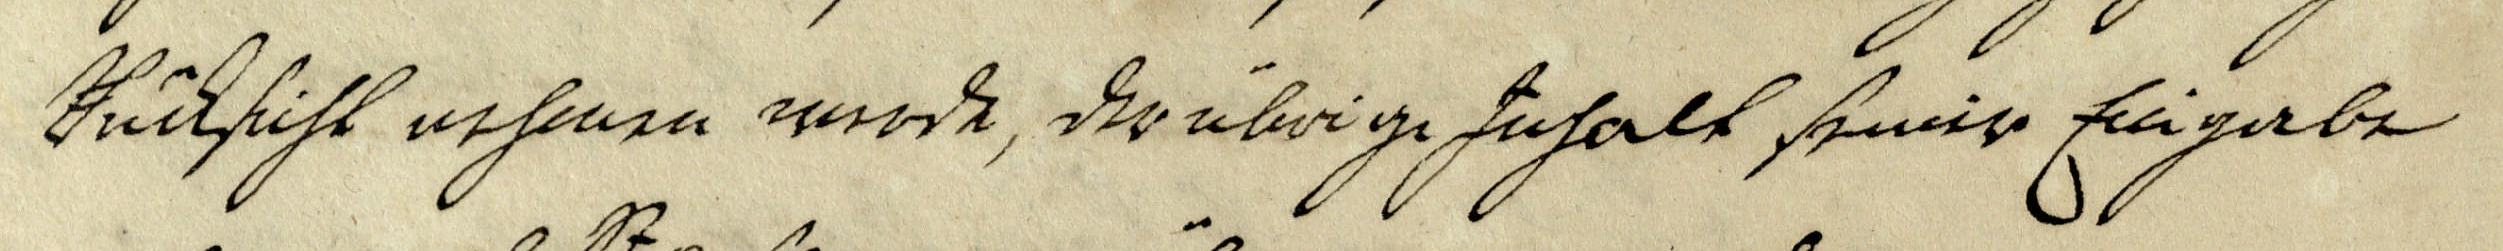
Rücksicht nehmen werde, der übrige Inhalt seiner Eingabe
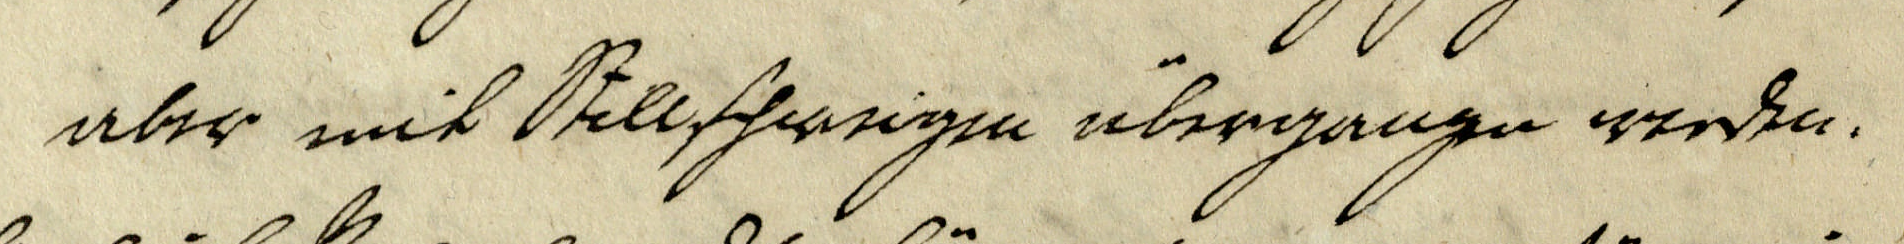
aber mit Stillschweigen übergangen werden.
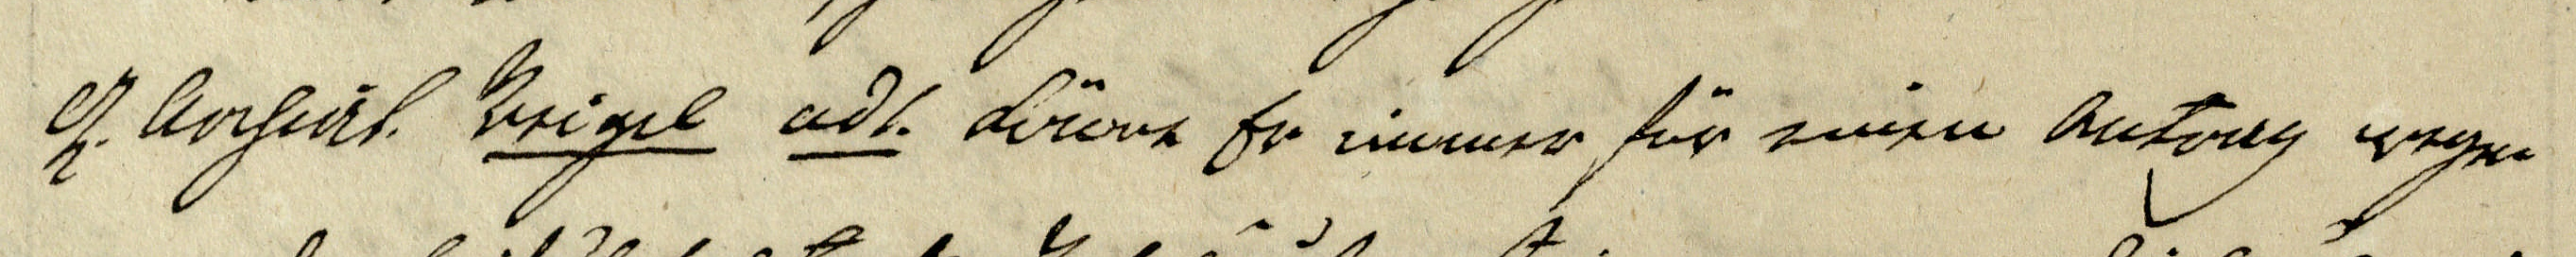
dh. Archiat. Weigel ad 1. könne Er immer für einen Antrag wegen
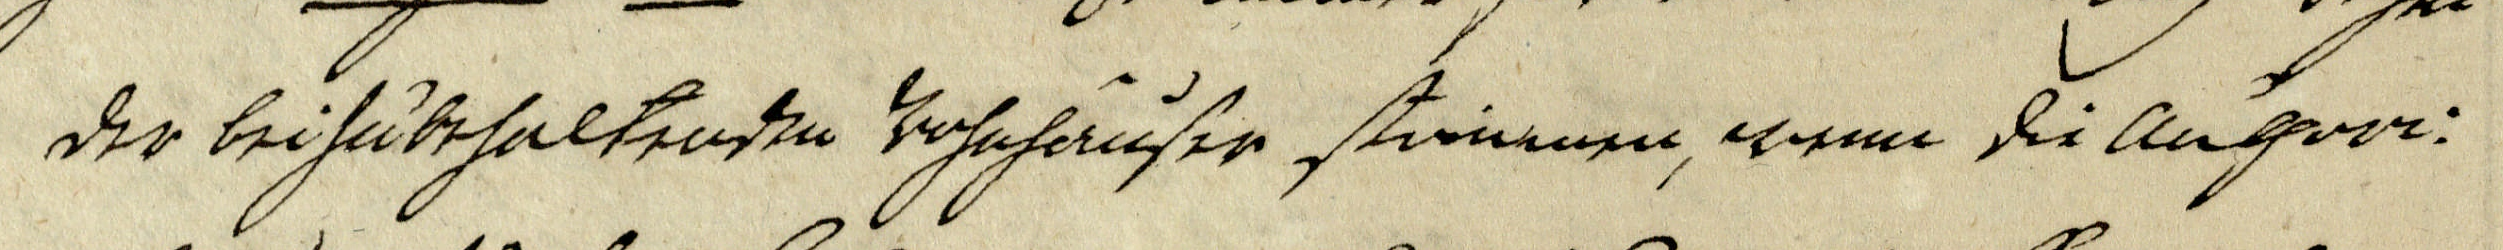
der beizubehaltenden Wohnhäuser stimmen, wenn die Authori¬
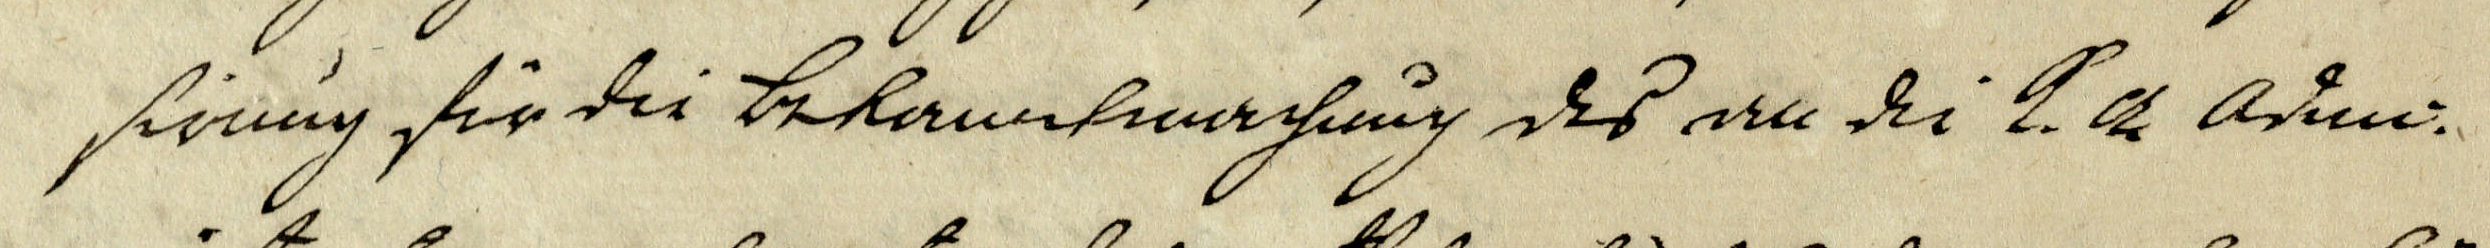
sirung für die Bekanntmachung des an die K. A. Admi¬
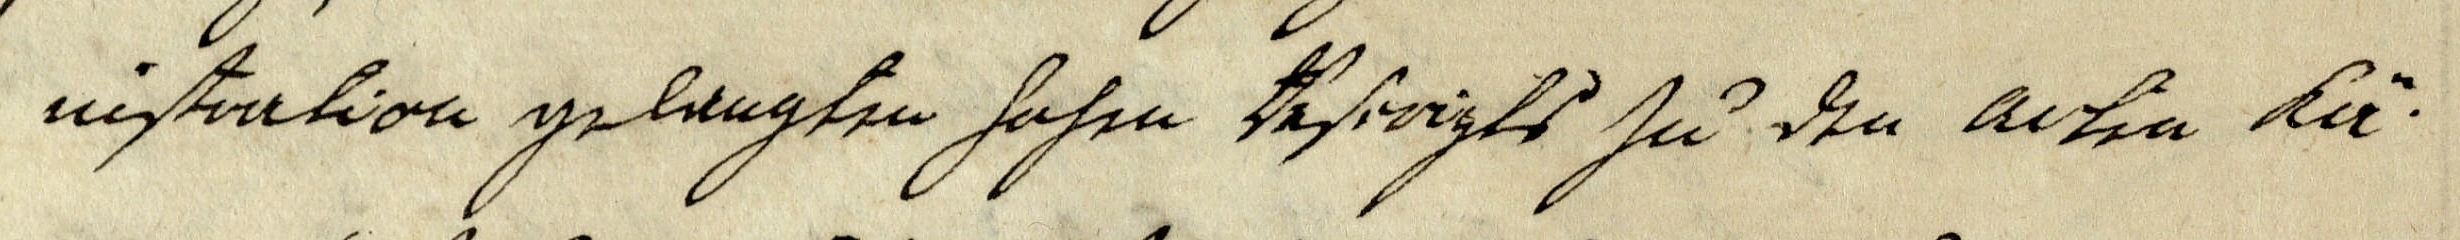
nistration gelangten hohen Rescripts zu den Acten kä¬
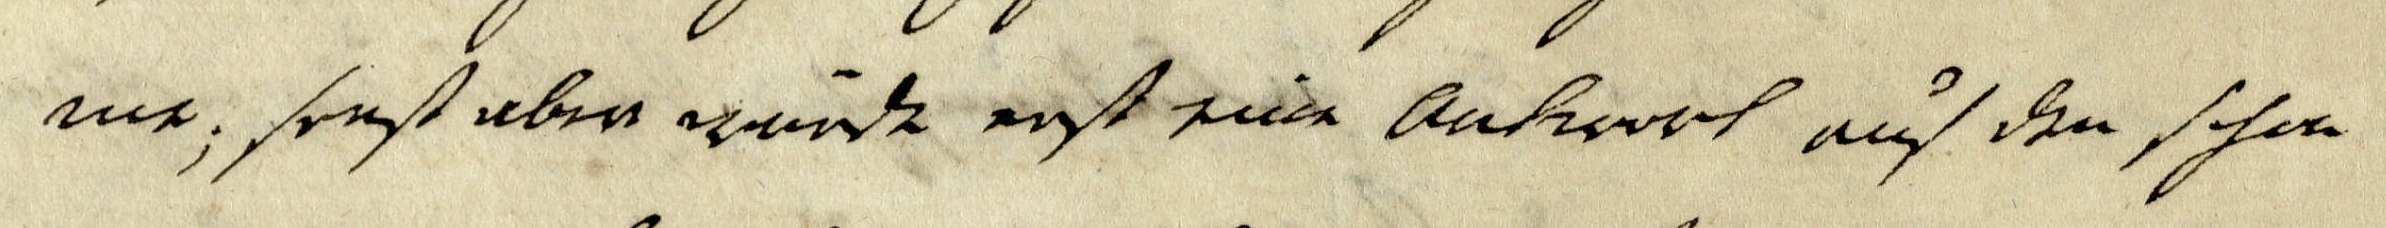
me; sonst aber würde erst eine Antwort auf den schon
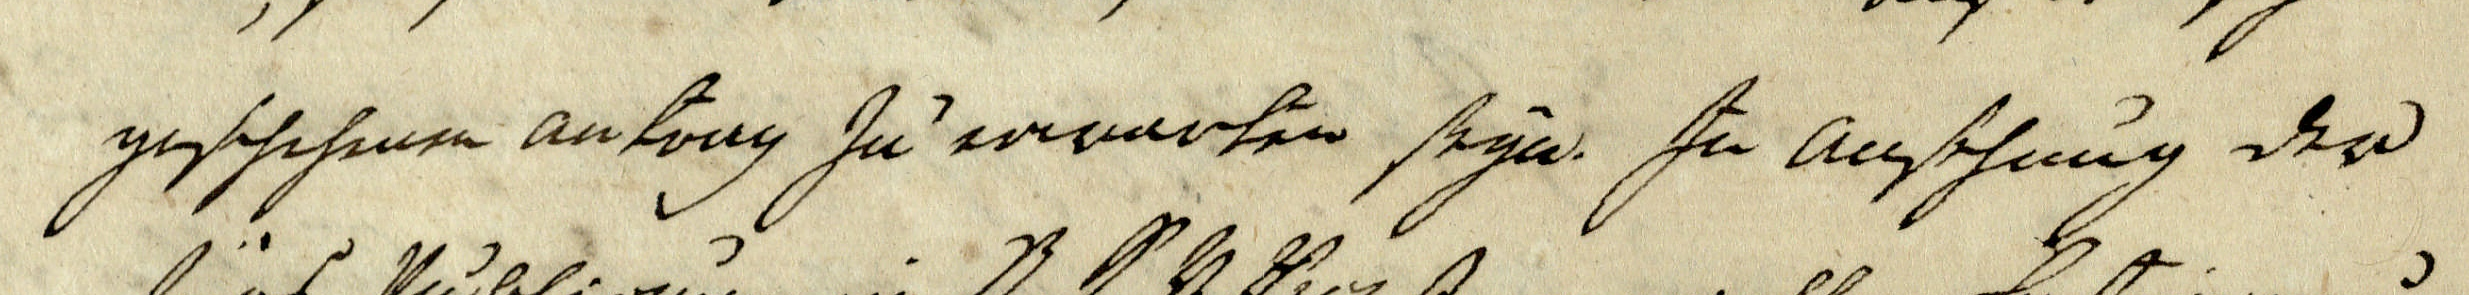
geschehenen Antrag zu erwarten seÿn. In Ansehung der
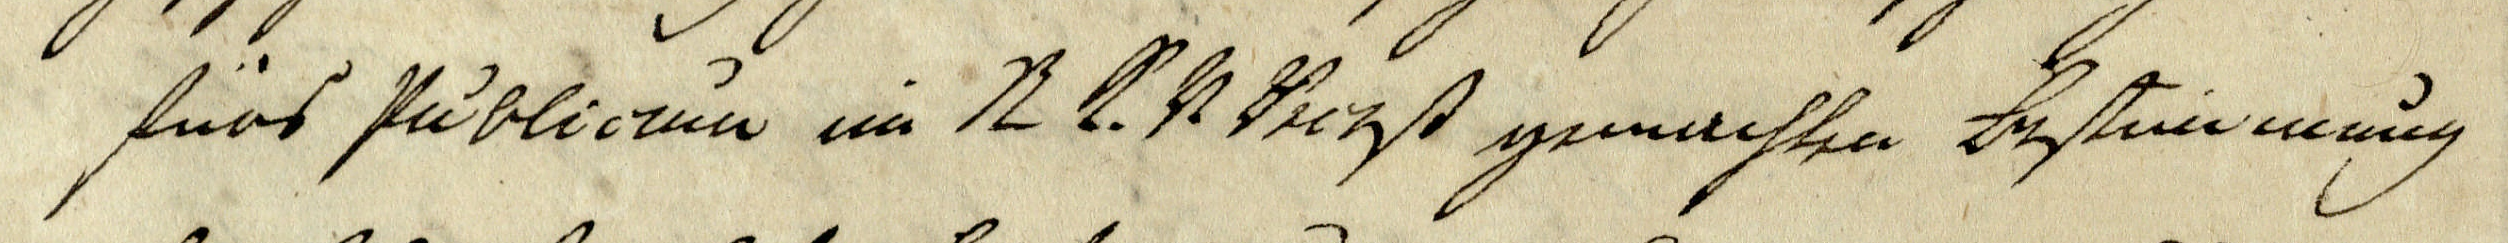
fürs Publicum im N. K. R. Receß gemachten Bestimmung
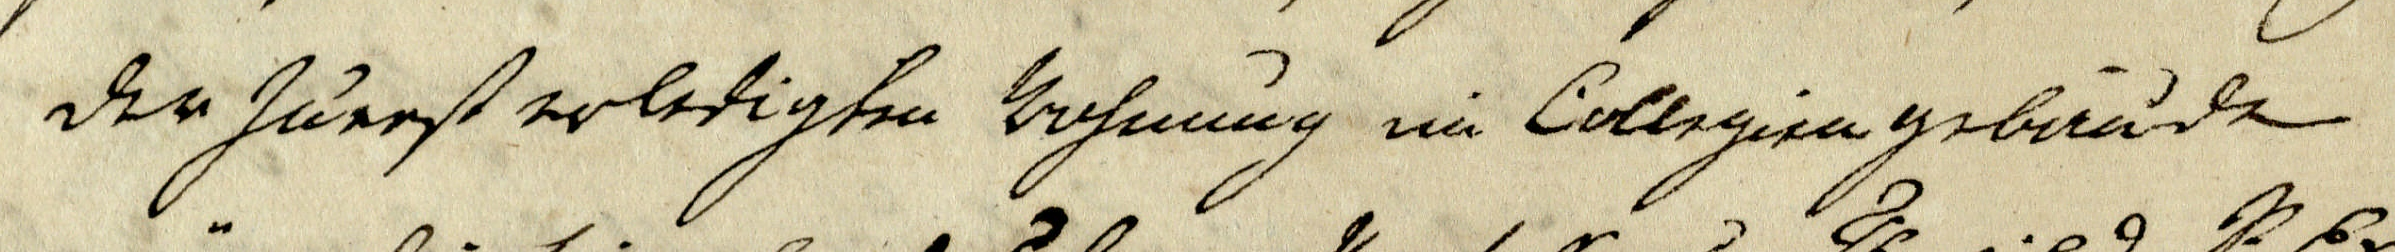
der zuerst erledigten Wohnung im Collegiengebäude
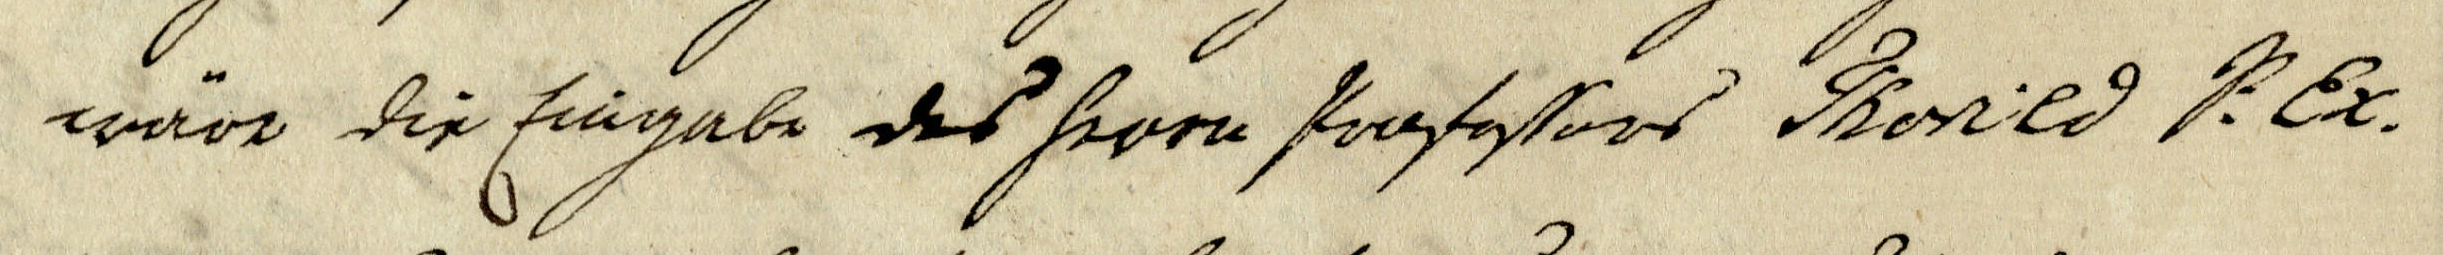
wäre die Eingabe des Herrn Professors Thorild Sr Ex¬
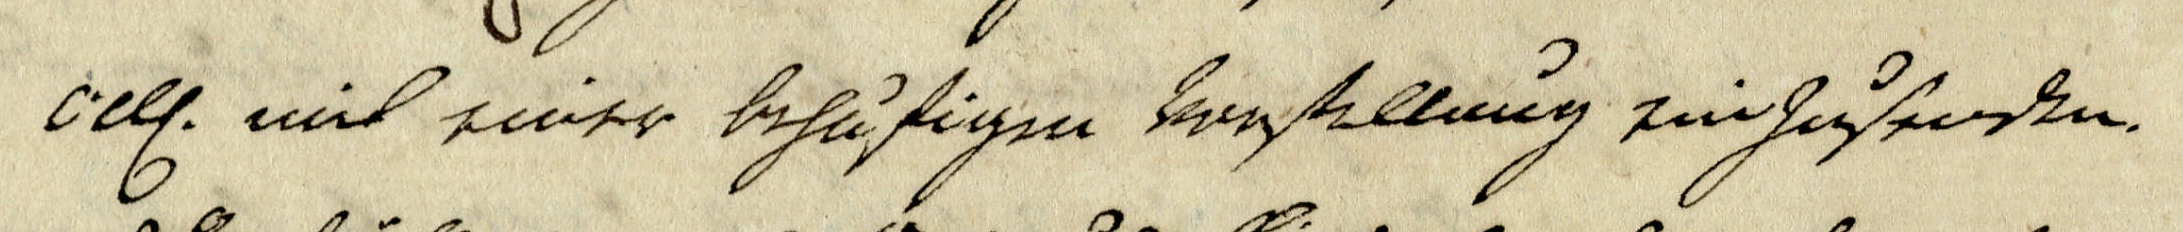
cell. mit einer behufigen Vorstellung einzusenden.
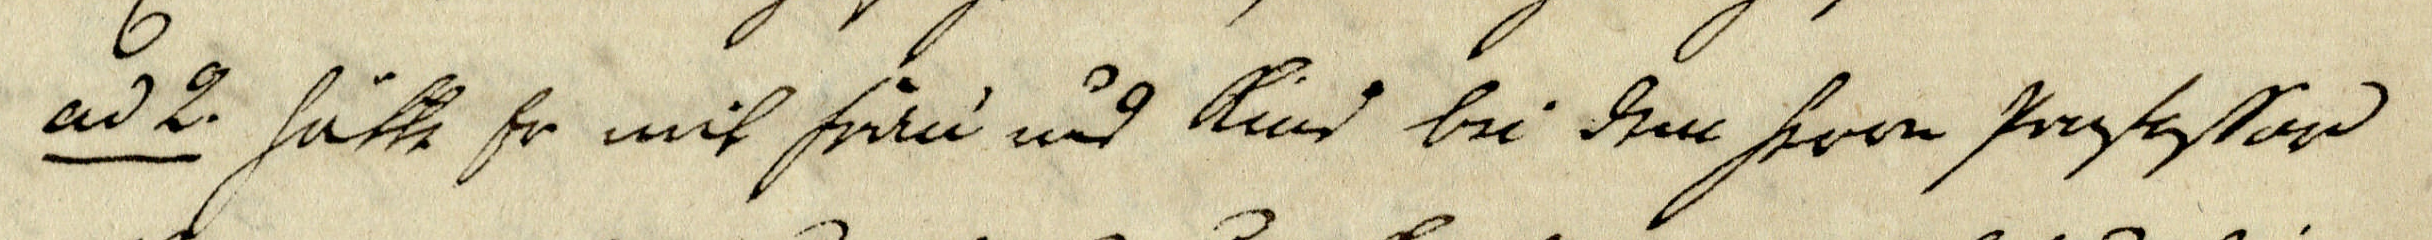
ad 2. hätte Er mit Frau und Kind bei dem Herrn Professor
